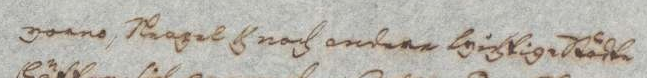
vorno, Neapel & noch andere wichtige Städte
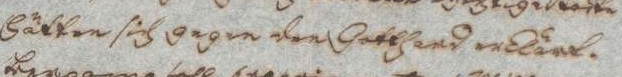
hätten sich gegen den Gotthard erklärt.
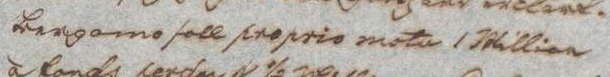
Bergamo soll proprio motu 1 Million
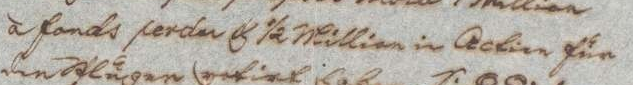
à fonds perdu & ½ Million in Actien für
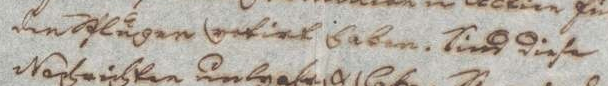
den Splügen votirt haben. Sind diese
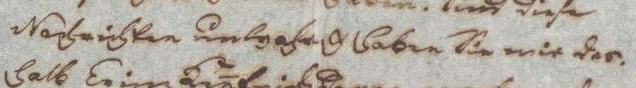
Nachrichten unwahr & haben Sie mir des-
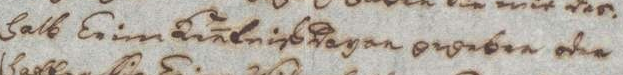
halb keine Kenntniß davon gegeben oder
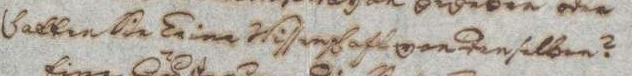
hatten Sie keine Wissenschaft von denselben?
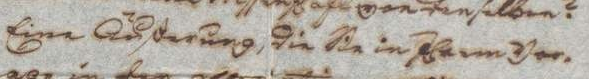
Eine Äußerung, die Sie in Ihrem Vor-
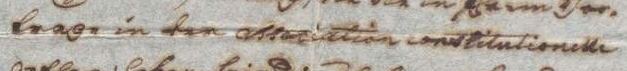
trage in der association constitutionelle
